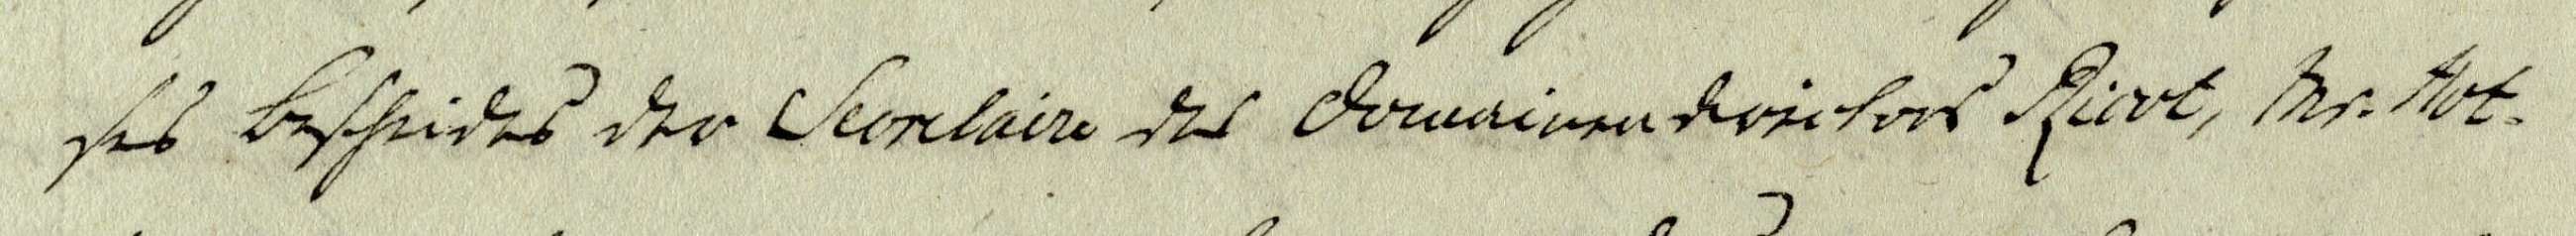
ses Bescheides der Secretaire des Domainendirectors Ricot, Mr. Hot¬
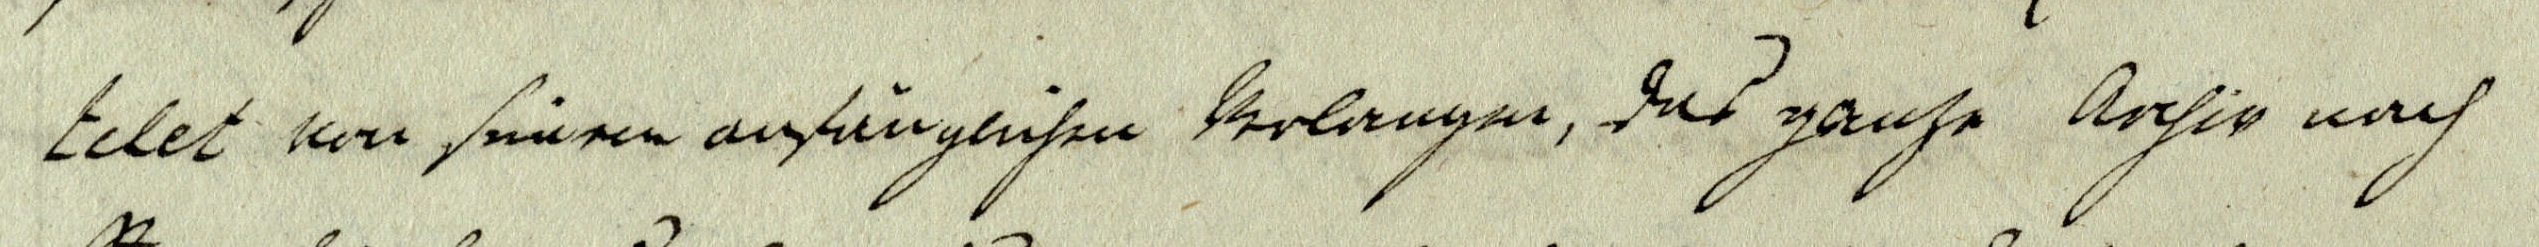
telet von seinem anfänglichen Verlangen, das ganze Archiv nach
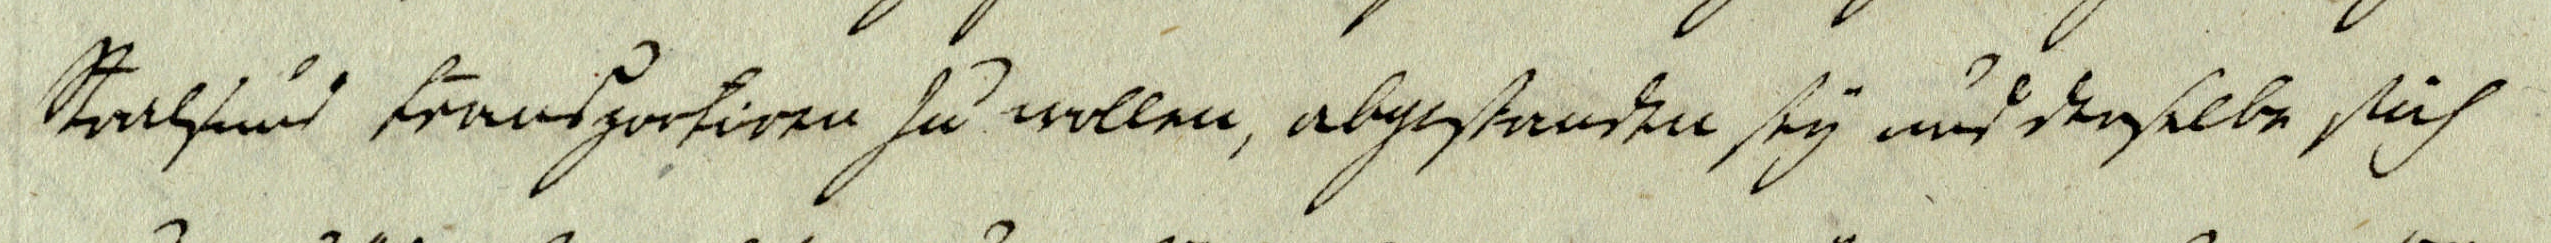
Stralsund transportiren zu wollen, abgestanden seÿ und derselbe sich
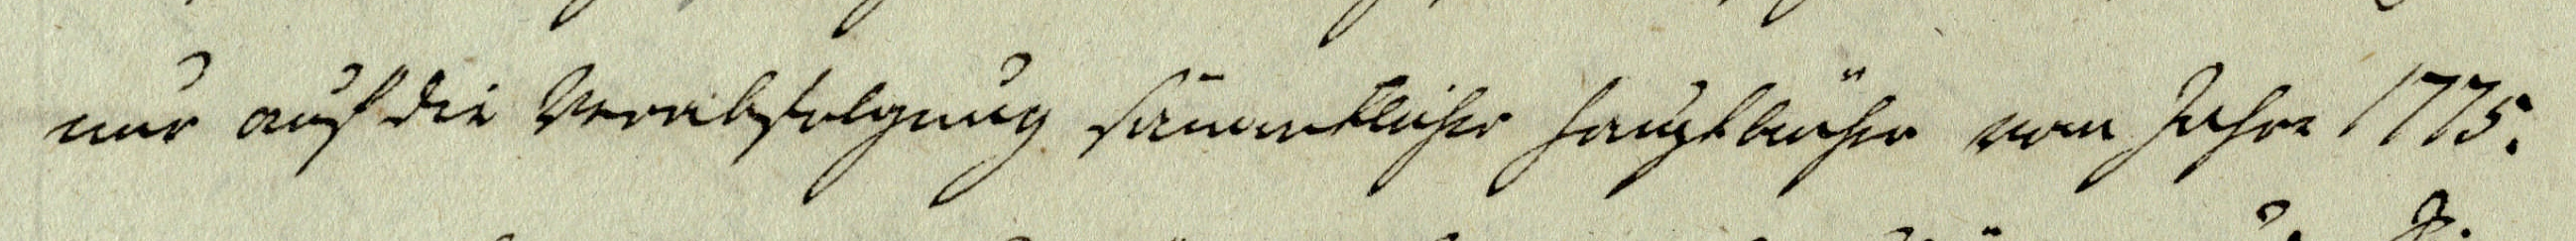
nur auf die Verabfolgung sämmtlicher Hauptbücher vom Jahre 1775.
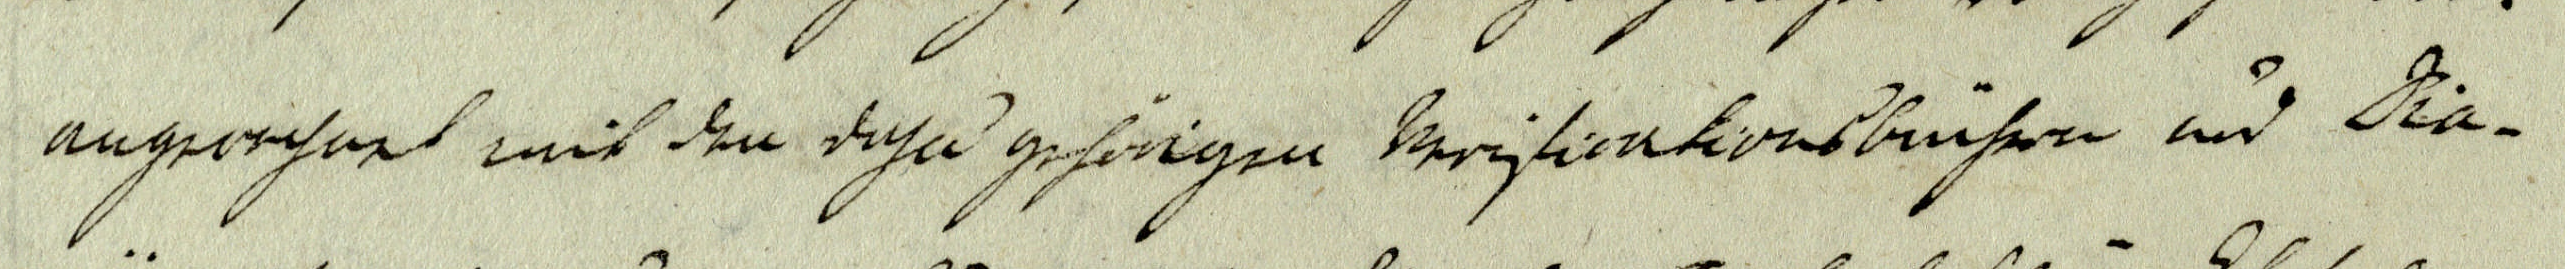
angerechnet mit den dazu gehörigen Verificationsbüchern und Dia¬
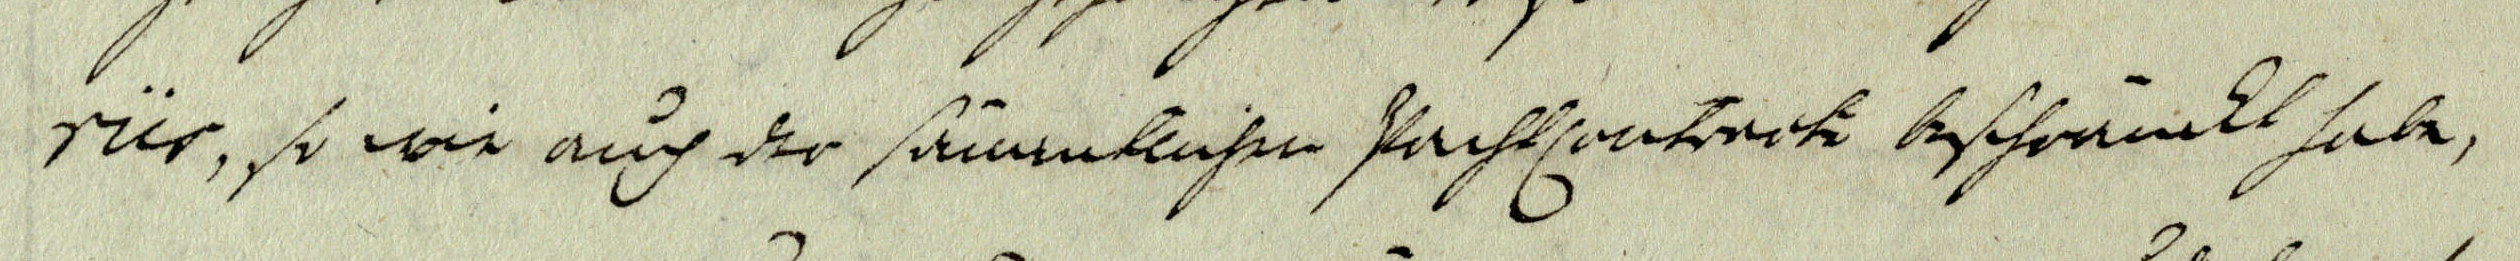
riis, so wie auch der sämmtlichen Pachtcontracte beschränkt habe,
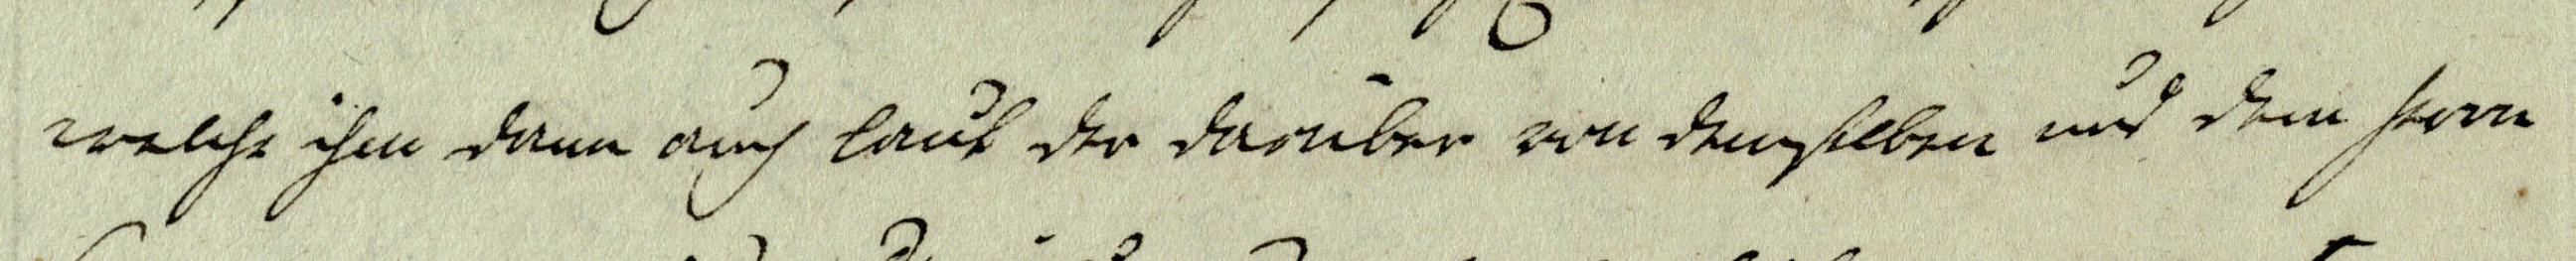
welche ihm dann auch laut der darüber von demselben und dem Herrn
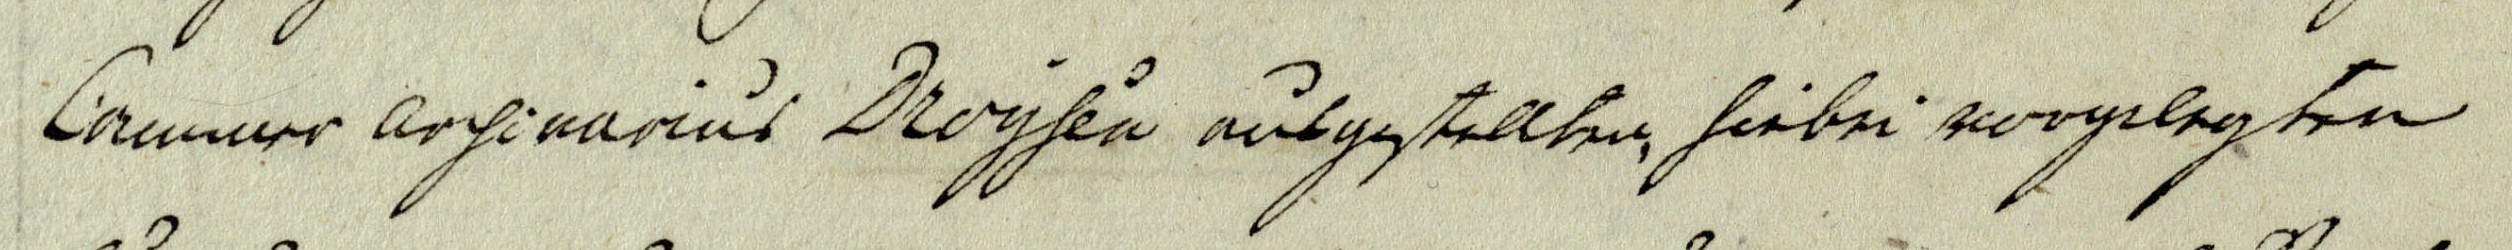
Cammer Archivarius Droÿsen ausgestellten, hiebei vorgelegten
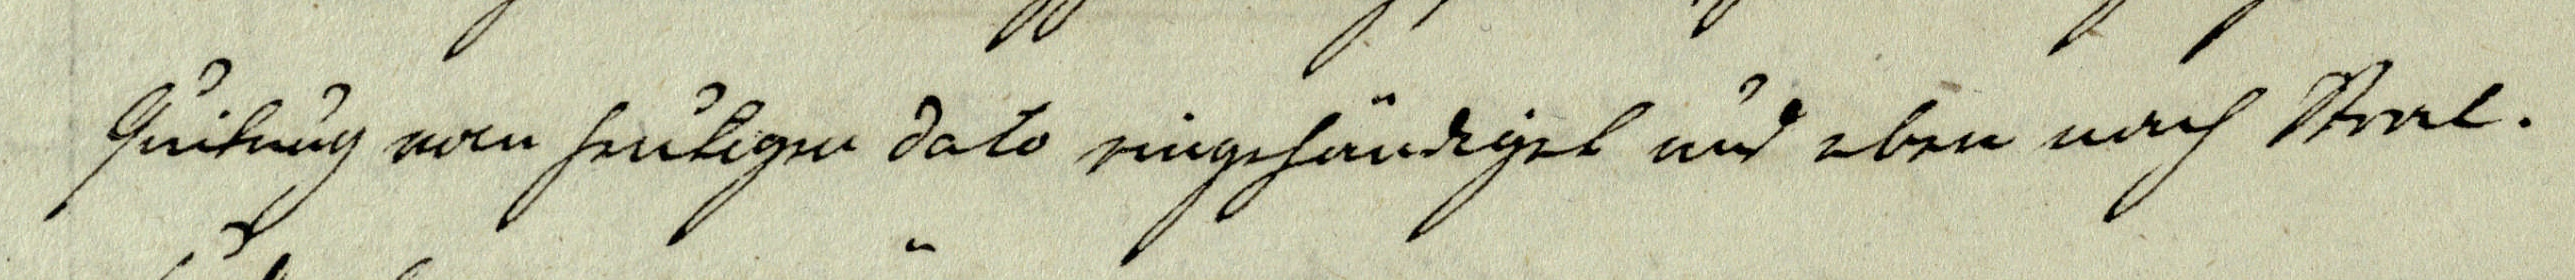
Quitung vom heutigen dato eingehändiget und eben nach Stral¬
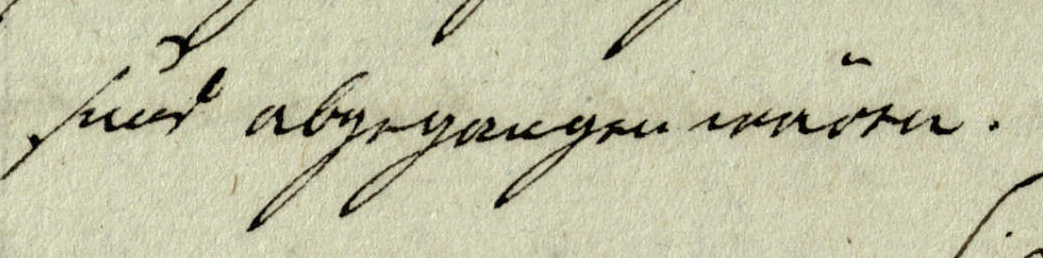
sund abgegangen wären.
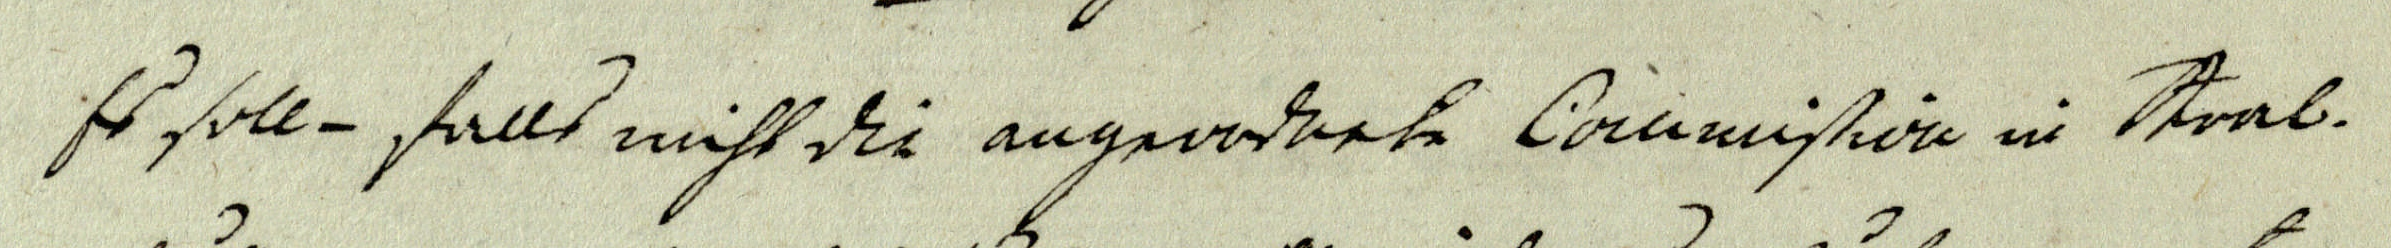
Es soll - falls nicht die angeordnete Commission in Stral¬
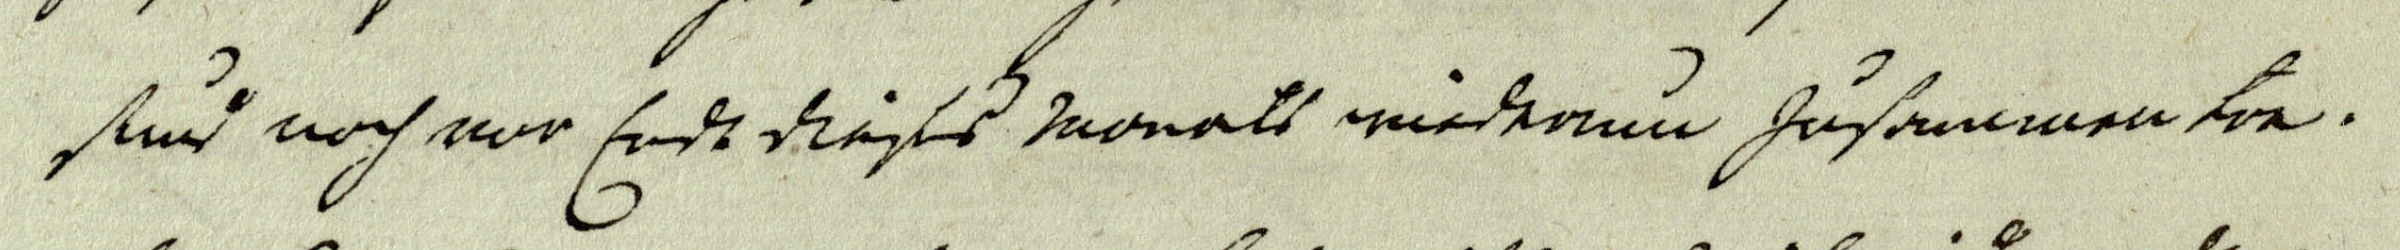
sund noch vor Ende dieses Monats wiederum zusammentre¬
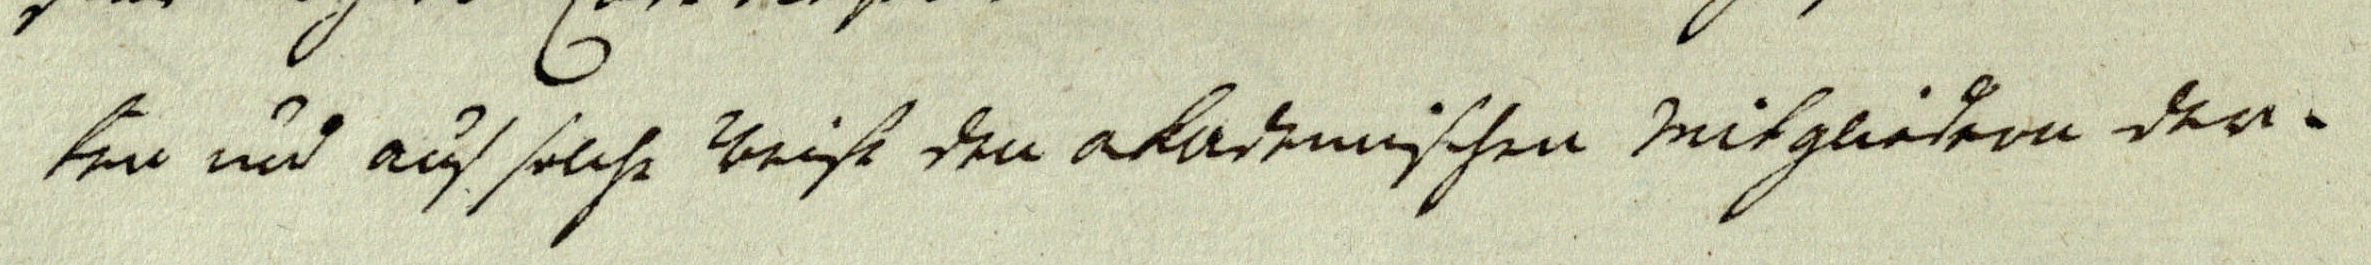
ten und auf solche Weise den akademischen Mitgliedern der¬
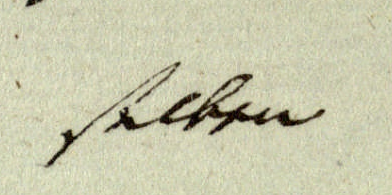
selben
